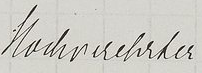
Hochverehrter
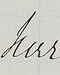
Freund
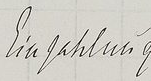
Subsidien macht
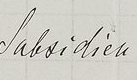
bedeutende
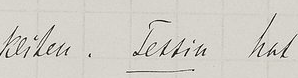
keiten. Tessin hat in
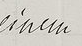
Schreiben
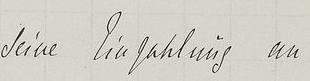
seine Einzahlung an
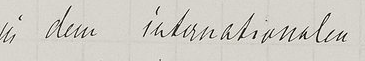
in dem internationalen
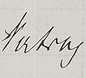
Vertrag
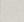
zwar
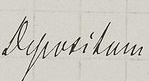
rechtzeitig
